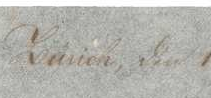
September
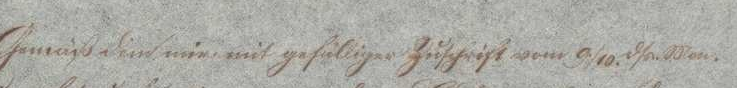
Gemäß dem mir mit gefälliger Zuschrift vom 9./10. dss. Mon.
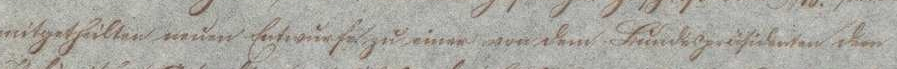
mitgetheilten neuen Entwurfe zu einer von dem Bundespräsidenten dem
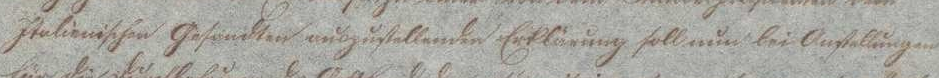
Italienischen Gesandten auszustellenden Erklärung soll nun bei Anstellungen
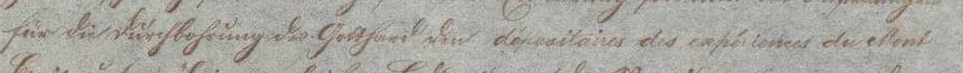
für die Durchbohrung des Gotthard den dépositaires des expériences du Mont
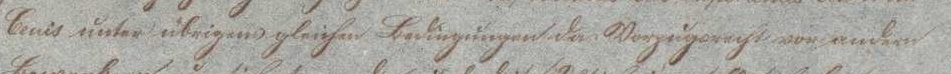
Cenis unter übrigens gleichen Bedinungen das Vorzugsrecht vor andern
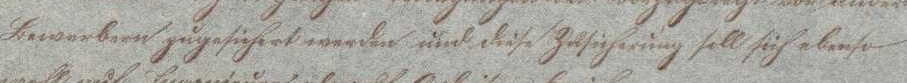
Bewerbern zugeführt werden und diese Zusicherung soll sich ebenso
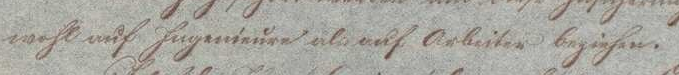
wohl auf Ingenieure als auf Arbeiter beziehen.
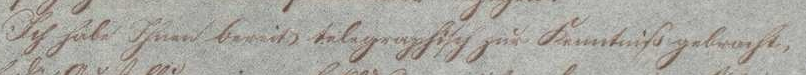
Ich habe Ihnen bereits telegraphisch zur Kenntniß gebracht,
